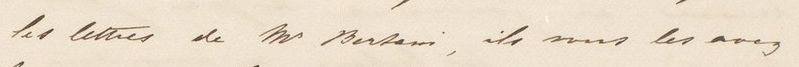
les lettres de MrBertani, ils vous les avez
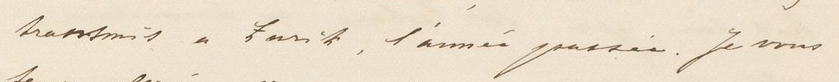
transmis a Zurik, l'année passée. Je vous
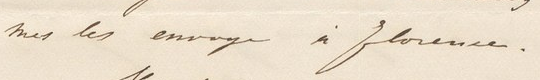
mes les envoye à Florence.
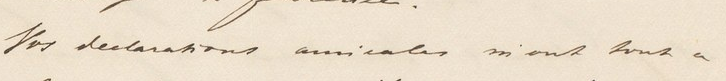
Vos declarations amicales m'ont tout a
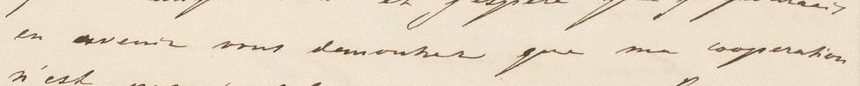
en avenir vous demontrer que ma cooperation
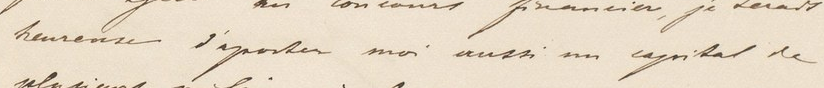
heurex d'aporter moi aussi un capital de
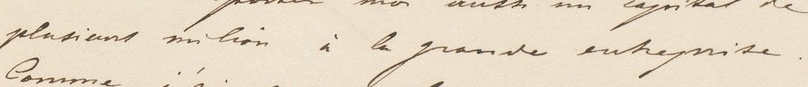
plusieurs milion à la grande entreprise.
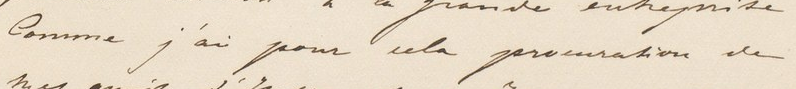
Comme j'ai pour cela procuration de
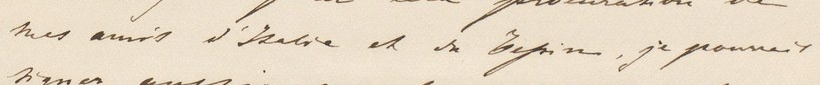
mes amis d'Italie et du Tessin, je pourrais
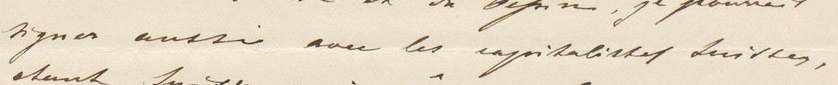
signer aussi avec les capitalistes Suisses,
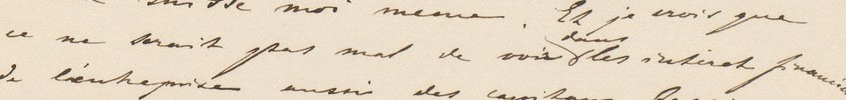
ce ne serait pas mal de voir dans les intèret financier
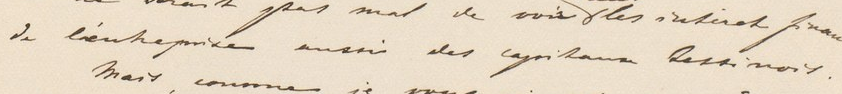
de l'entreprise aussi des capitaux Tessinois.
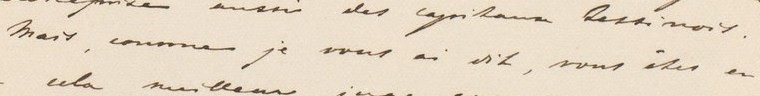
Mais, comme je vous ai dit, vous êtes en
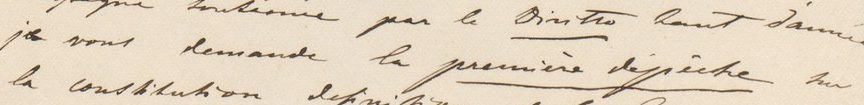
je vous demande la première dépêche sur
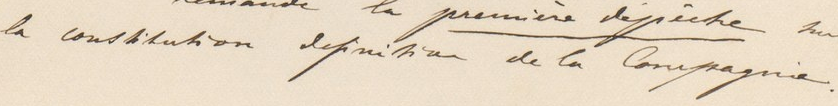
la constitution definitive de la Compagnie.
